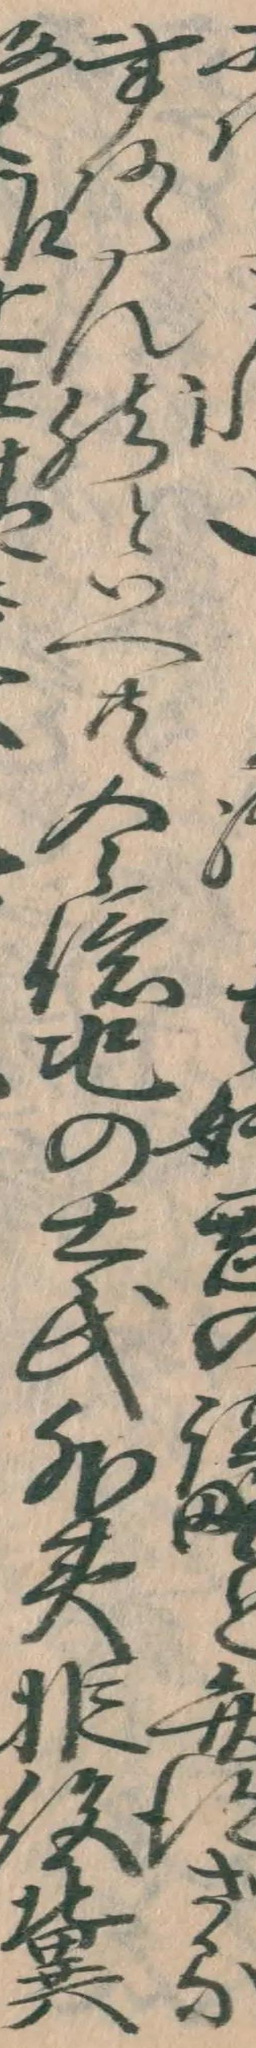事あらん然といへ共今億兆の士民外夷拒絶冀
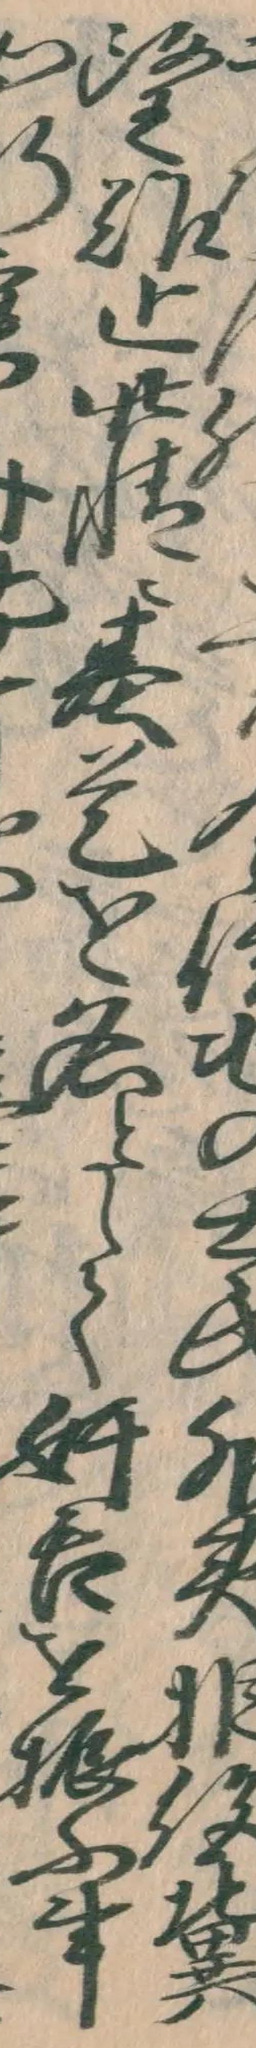望難止此情ニ基是を名として奸舌を振ふ事
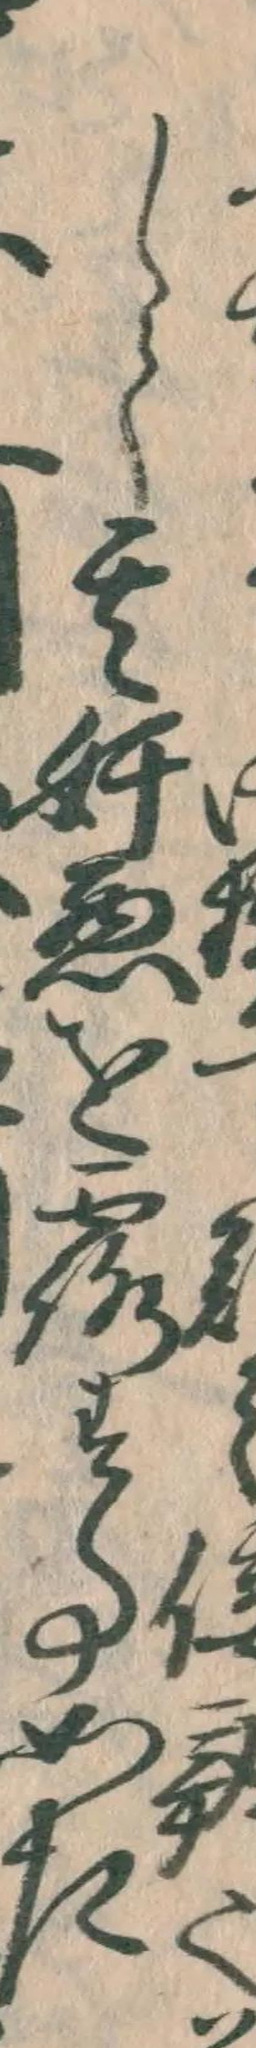して其奸悪を露す事如左
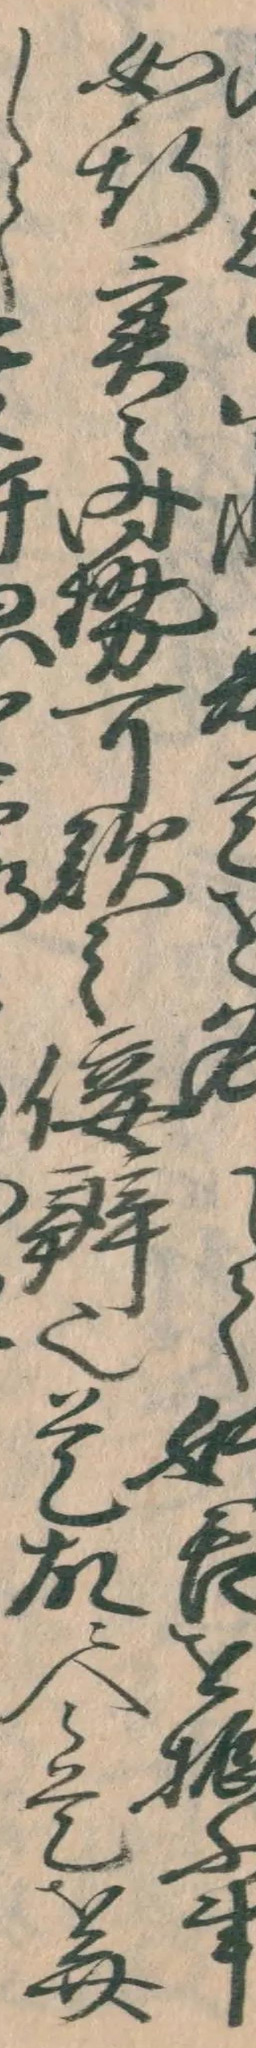如斯実ニ時勢可歎之佞辨也是故ニ今是を弁
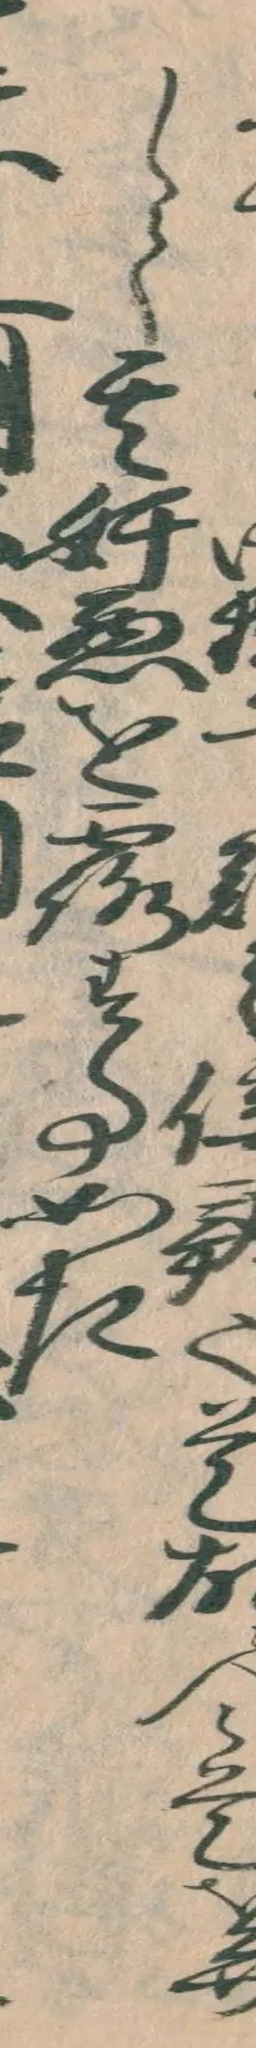して其奸悪を露す事如左
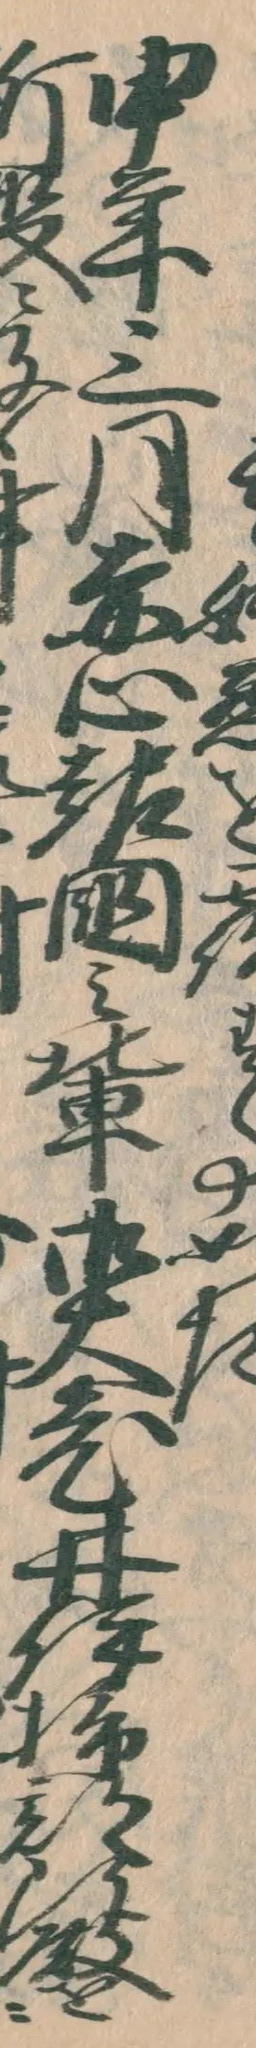申年三月赤心報国之輩御大老井伊掃部頭殿を
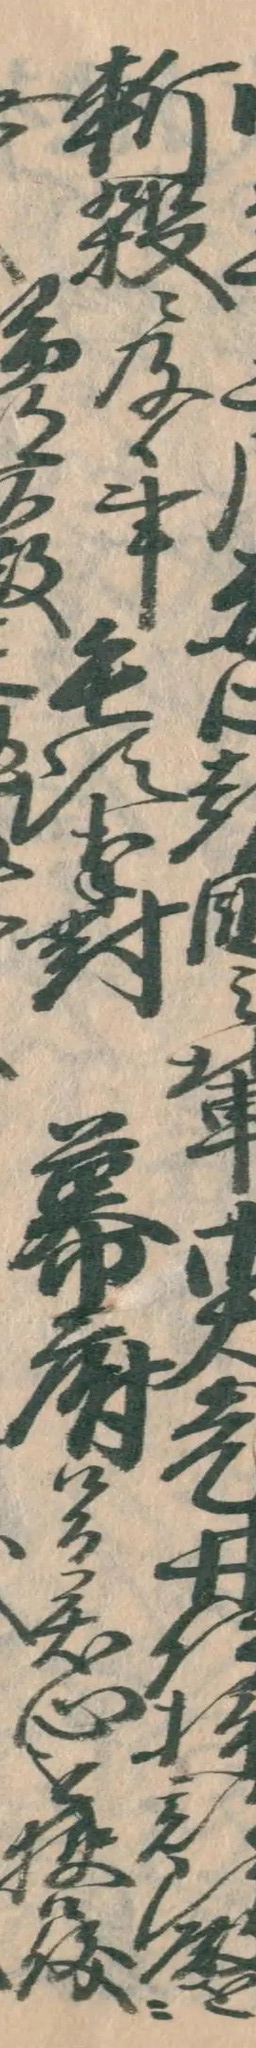斬殺ニ及候事毛頭奉對幕府候而異心を挟候儀ニ
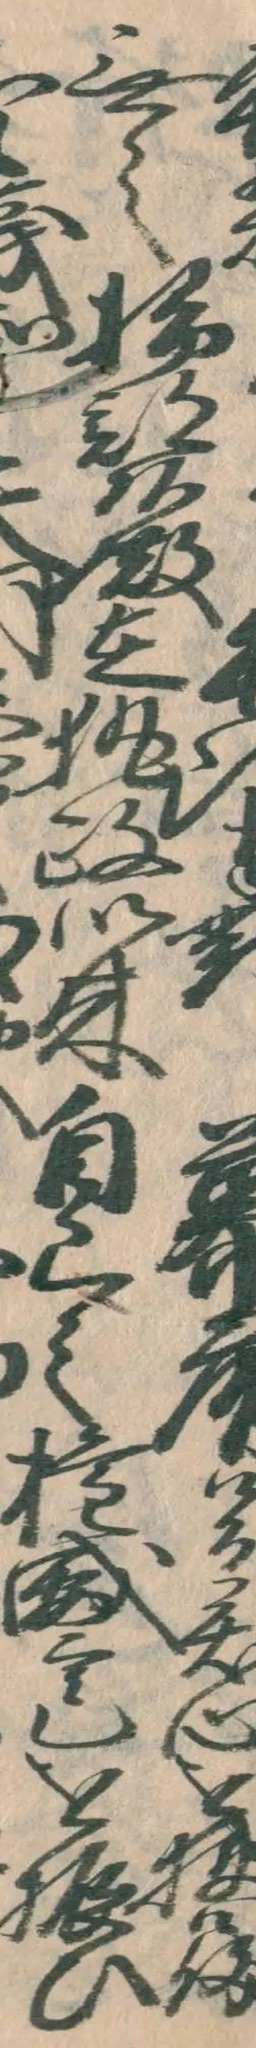無之掃部頭殿在執政以来自己之権威而已を振ひ
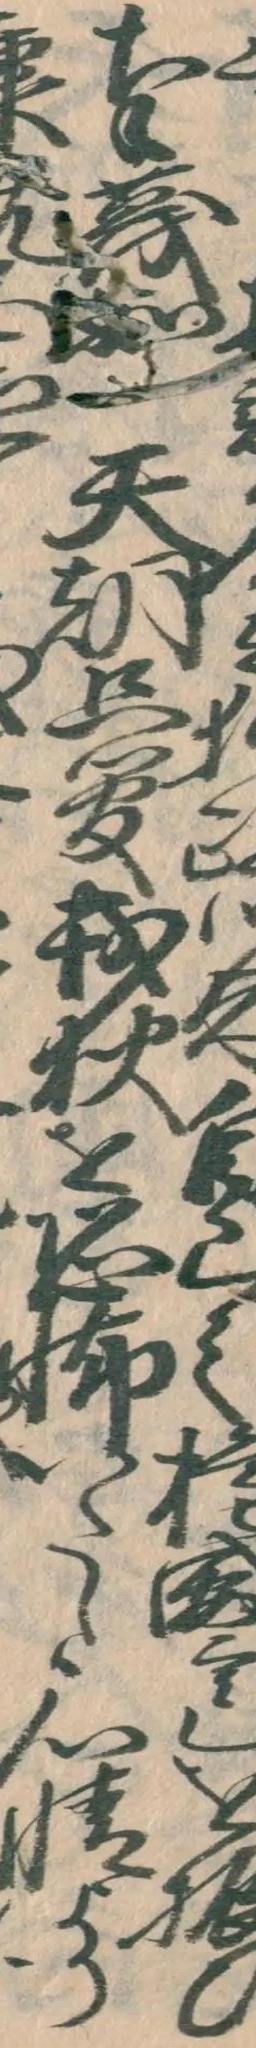奉蔑如天朝只管戎狄を恐怖いたし候心情より
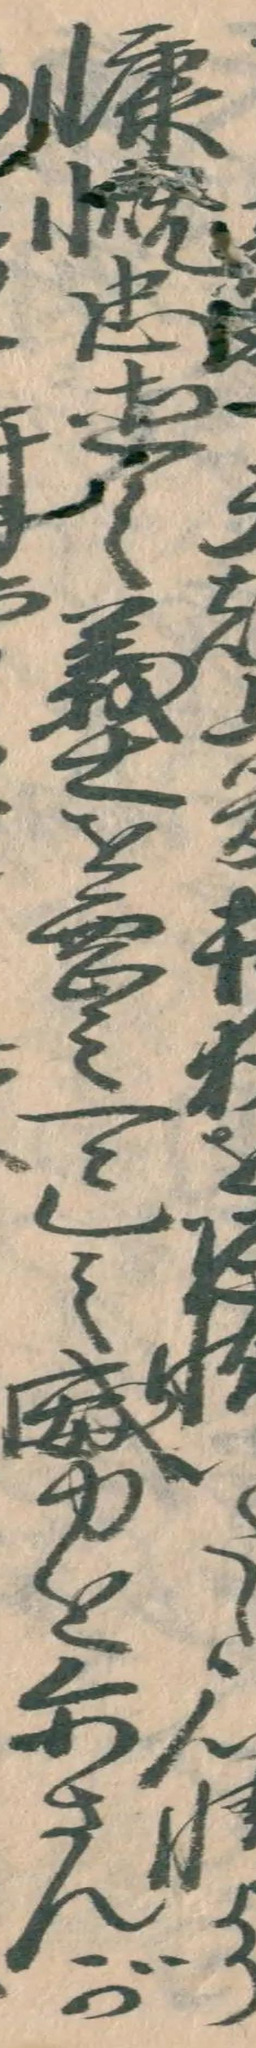慷慨忠直之義士を悪ミ一己之威力を示さんが
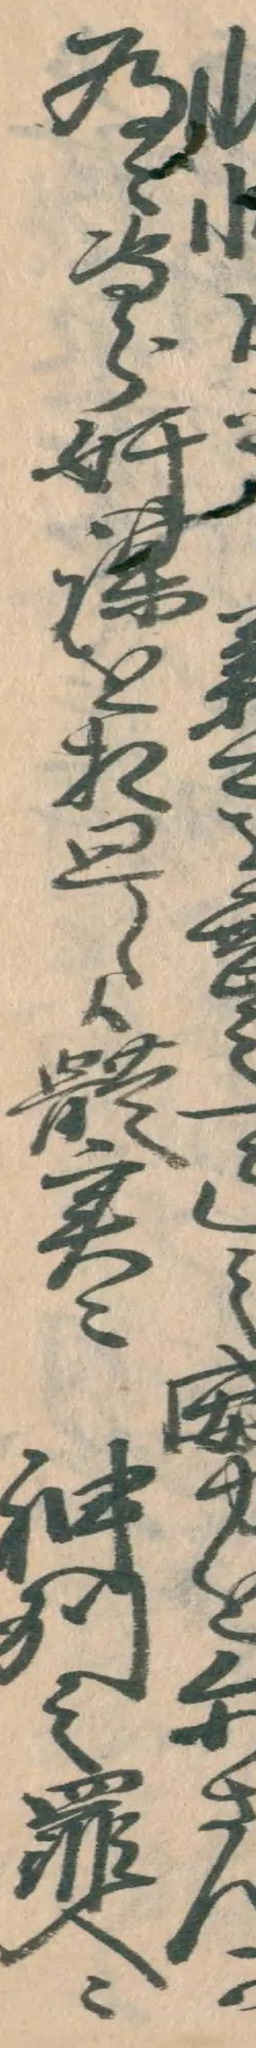為ニ専ら奸謀を相廻し候體実ニ神州之罪人ニ

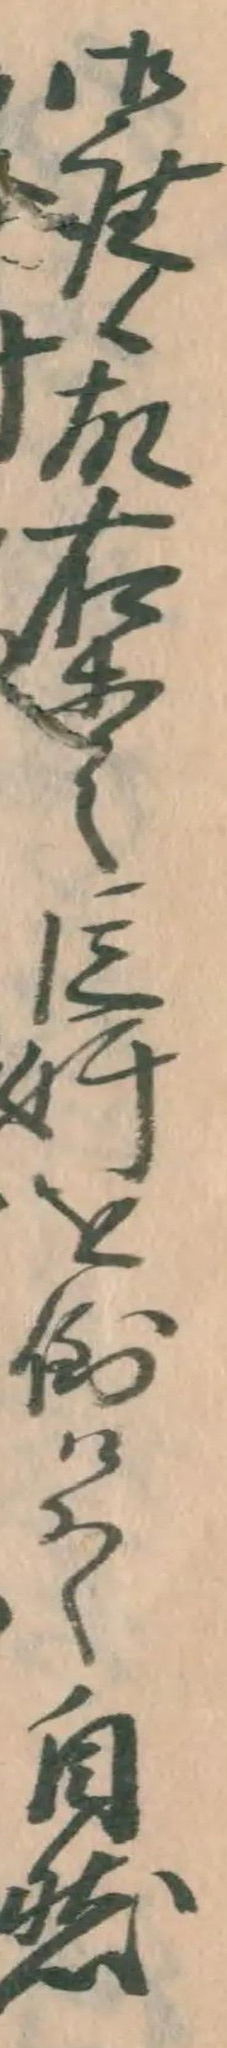御座候故右等の臣奸を倒候ハヽ自然
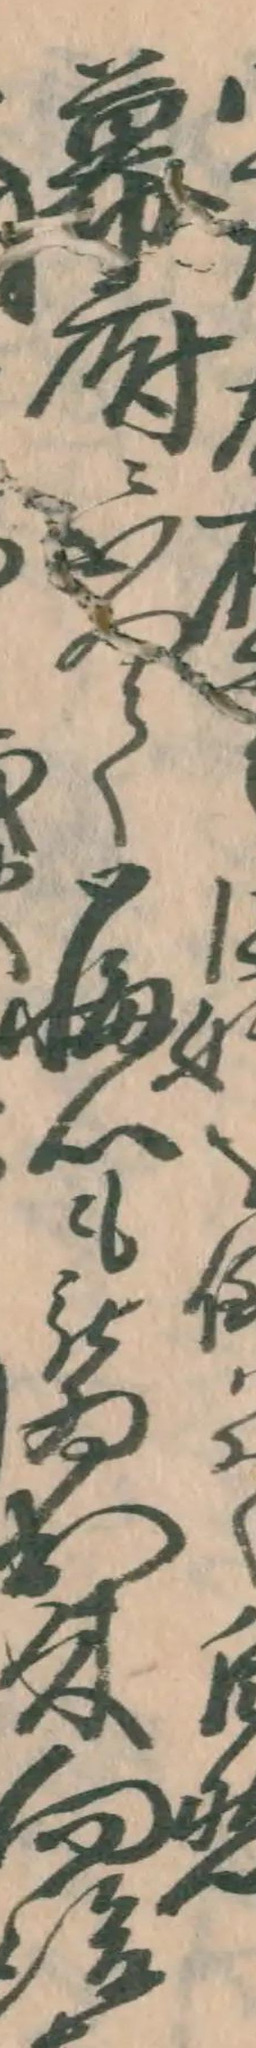幕府ニおゐて御悔心も被為出来向後者
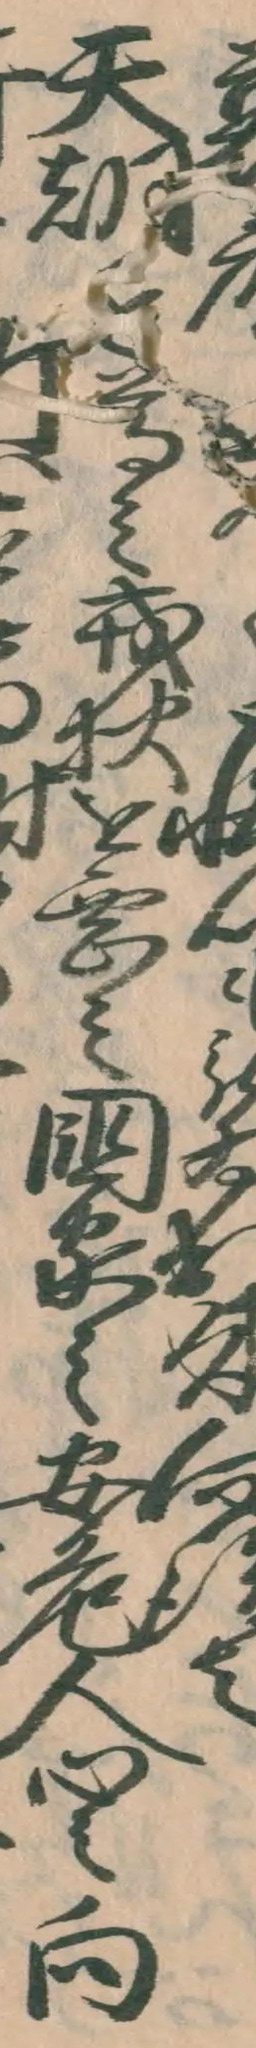天朝を尊ミ戎狄を悪ミ国家之安危人心之向
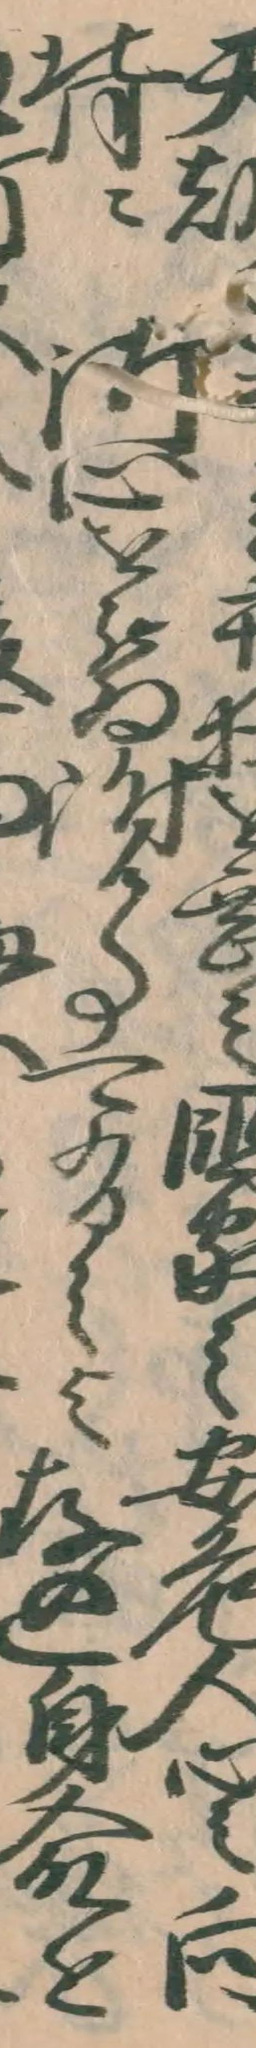背ニ御心を被為附候事可有之と存込身命を
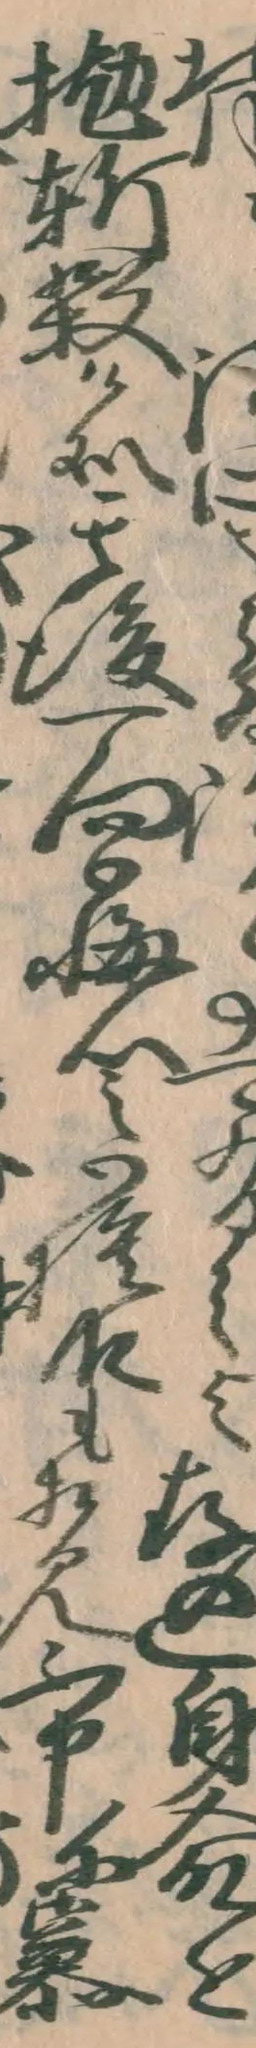抛斬殺候処其後一向御悔心之御模様も相見不申弥御暴
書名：麗斎叢書. 20
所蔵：国立国会図書館 National Diet Library, JAPAN
